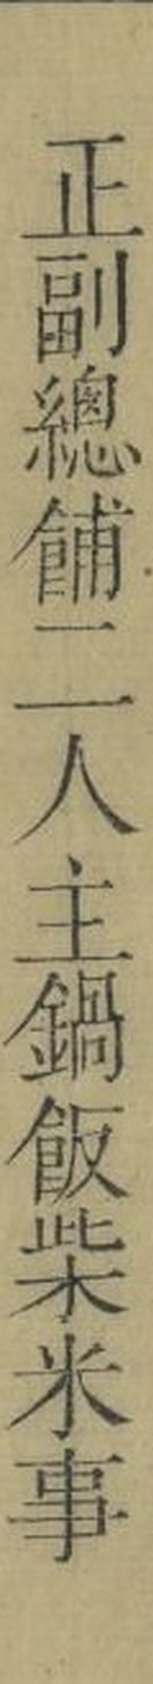正副總餔二人主鍋飯柴米事
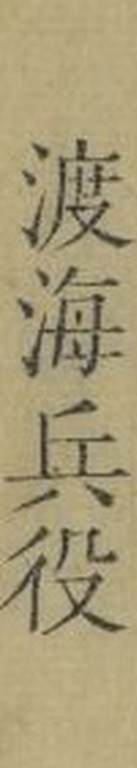渡海兵役
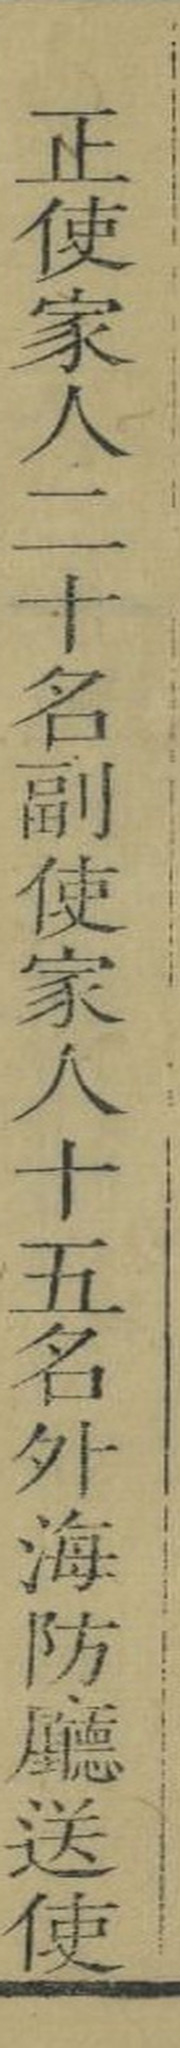正使家人二十名副使家人十五名外海防㕔送使
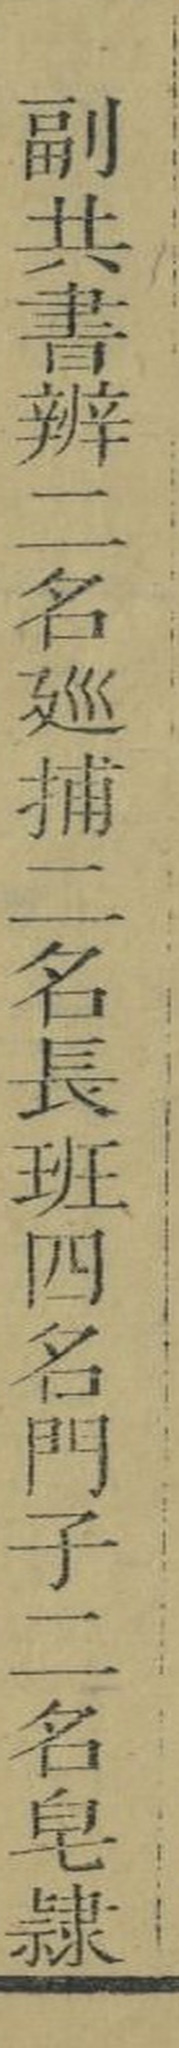副共書辨二名廵捕二名長班四名門子二名皂隷
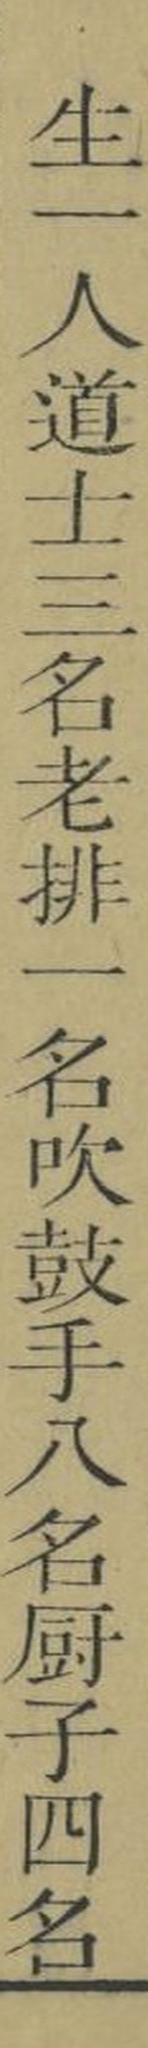生一人道士三名老排一名吹鼓手八名厨子四名
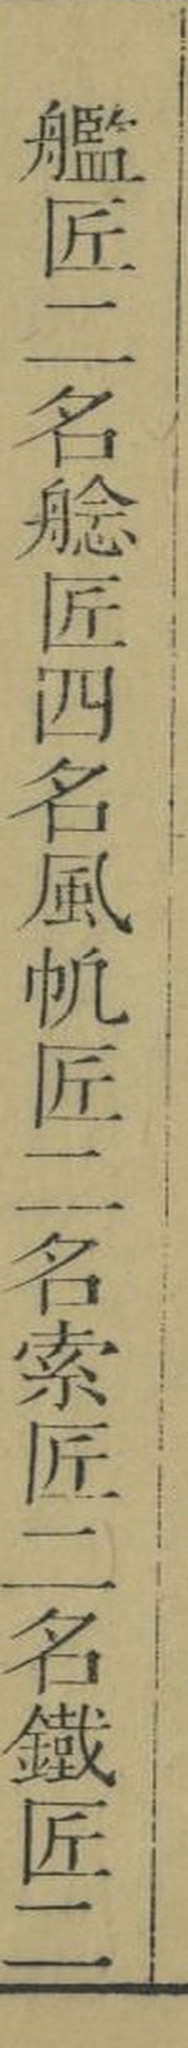艦匠二名艌匠四名風帆匠二名索匠二名鐵匠二
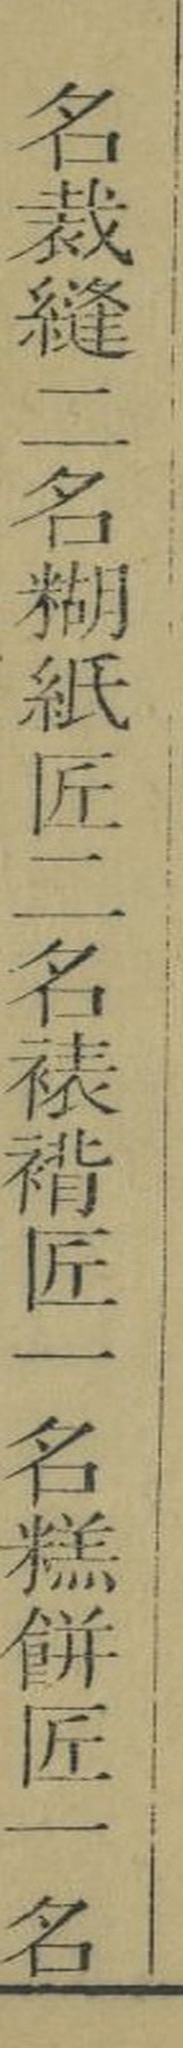名裁縫二名糊紙匠二名裱褙匠一名糕餅匠一名

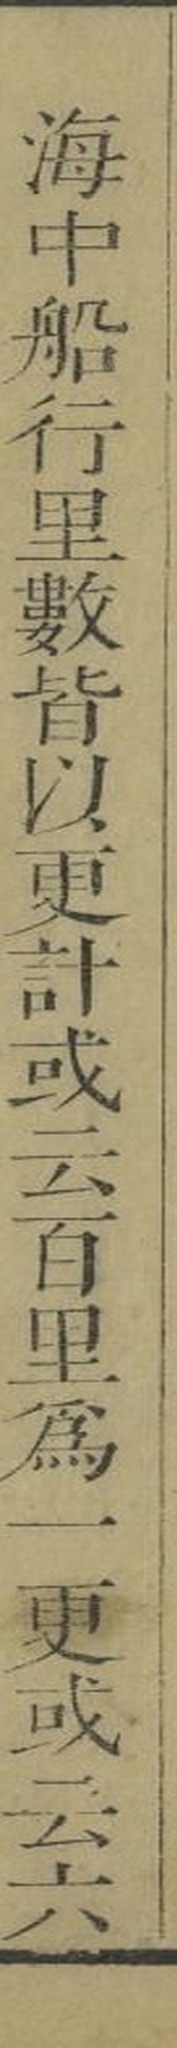海中船行里數皆以更計或云百里爲一更或云六
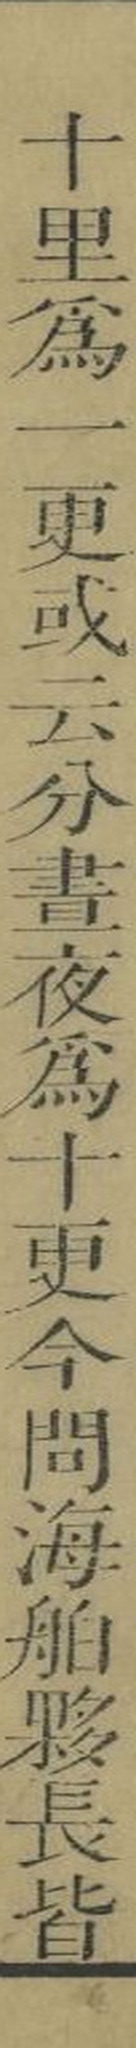十里爲一更或云分晝夜爲十更今問海舶夥長皆
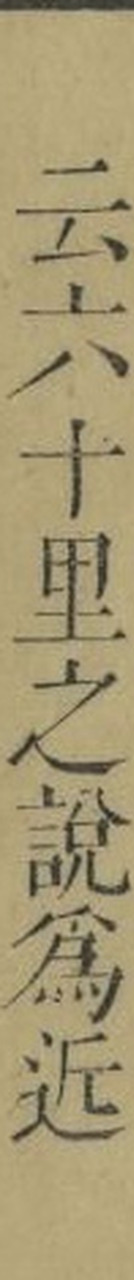云六十里之說爲近

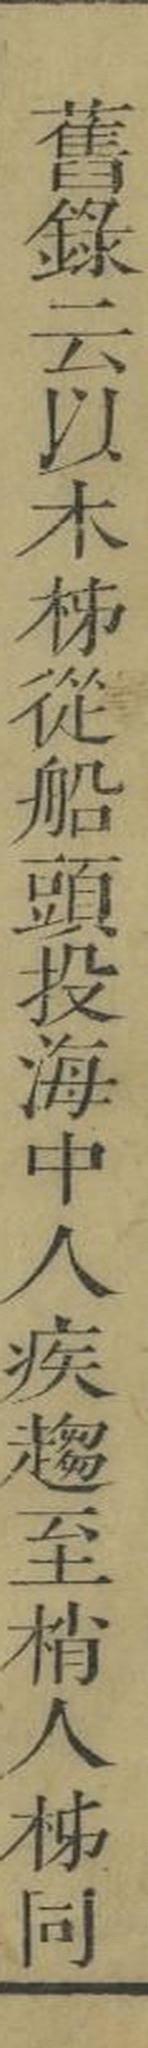舊錄云以木柹從船頭投海中人疾趨至梢人柹同
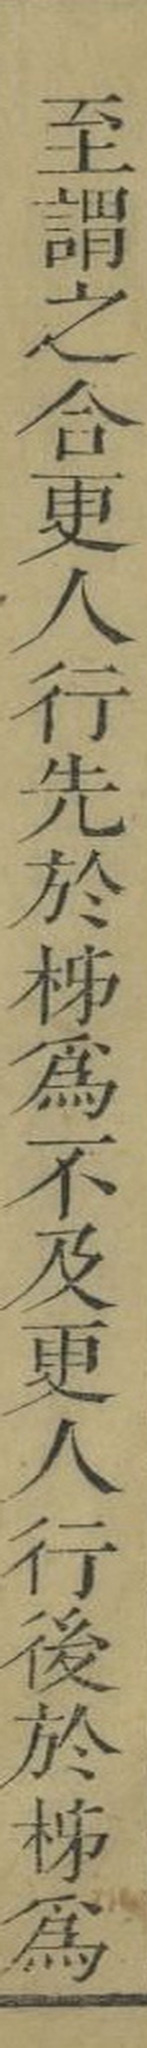至謂之合更人行先於柹爲不及更人行後於柹爲
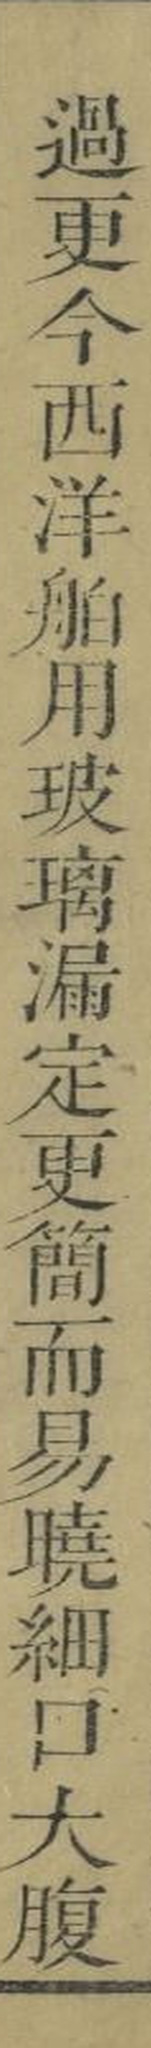過更今西洋舶用玻璃漏定更簡而易曉細口大腹
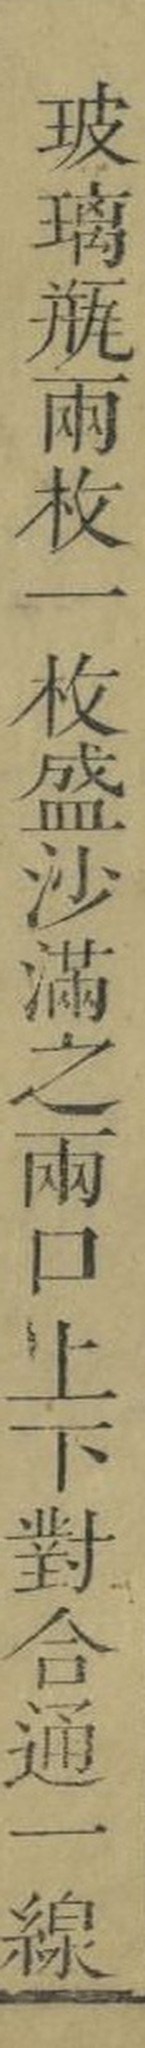玻璃瓶兩枚一枚盛沙滿之兩口上下對合通一線
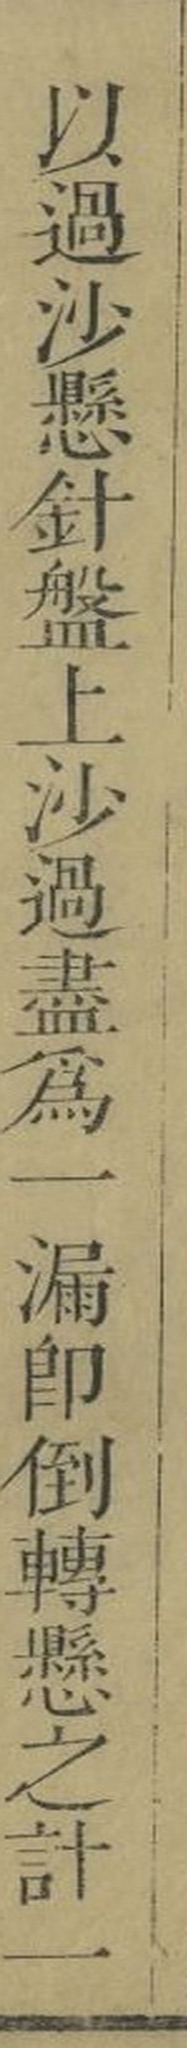以過沙懸針盤上沙過盡爲一漏卽倒轉懸之計一
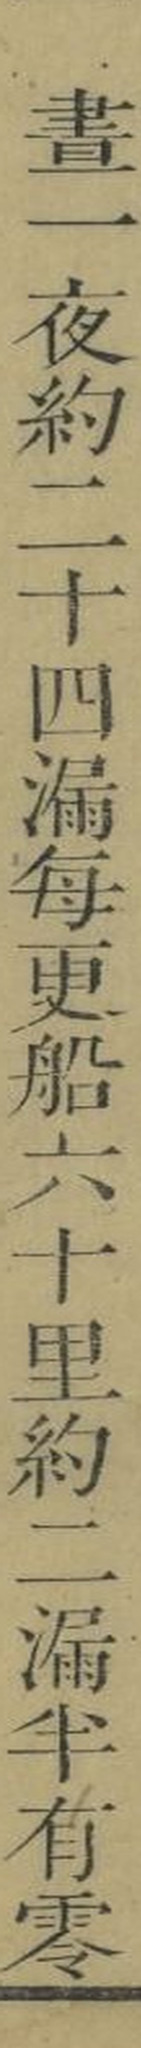晝一夜約二十四漏每更船六十里約二漏半有零
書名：中山伝信録 巻一
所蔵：University of the Ryukyus Library
